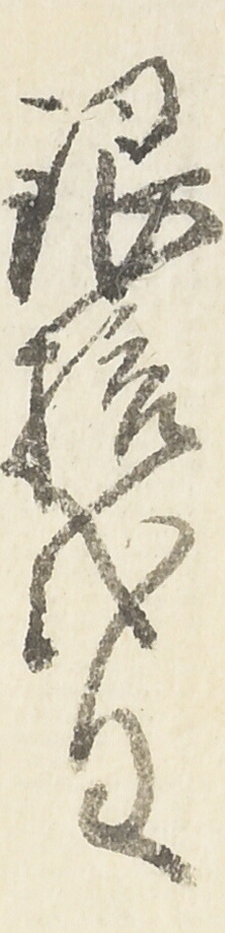銀拾弐匁
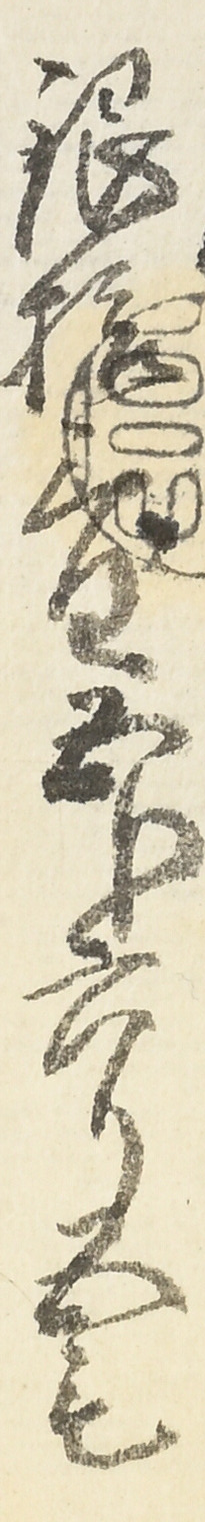銀拾三匁五分六厘五毛

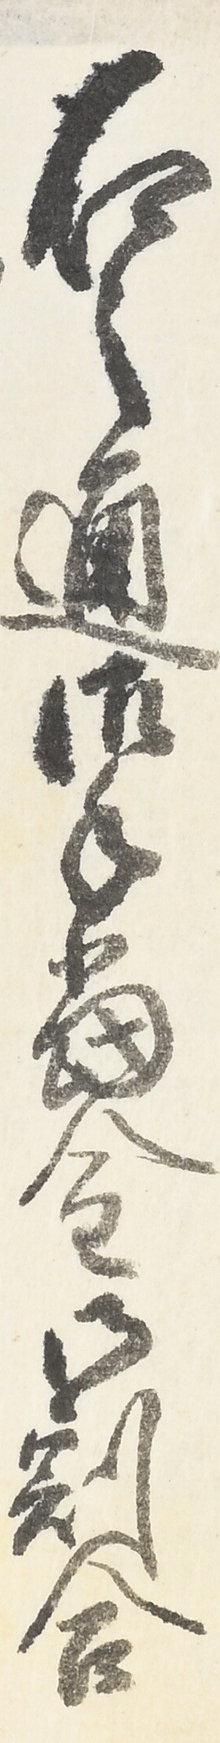右之通御手当金御割合
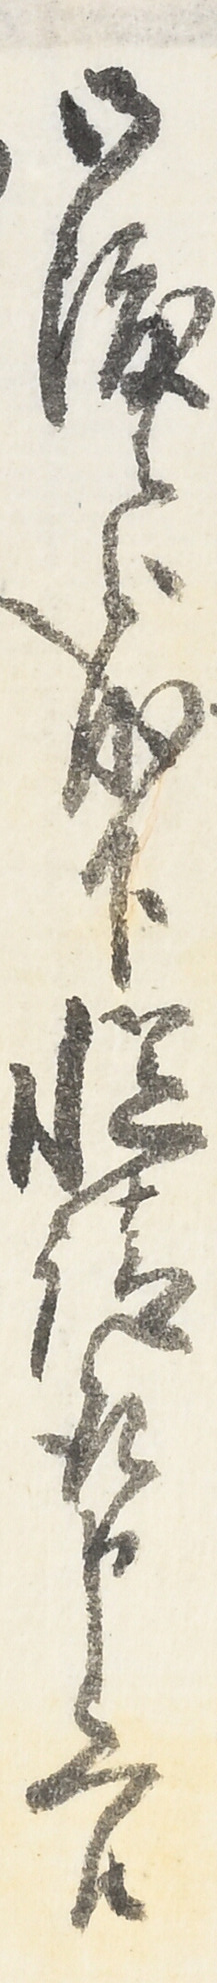御渡被成下置請取申上候
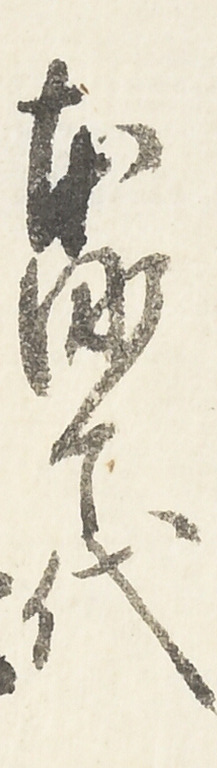本町丁代
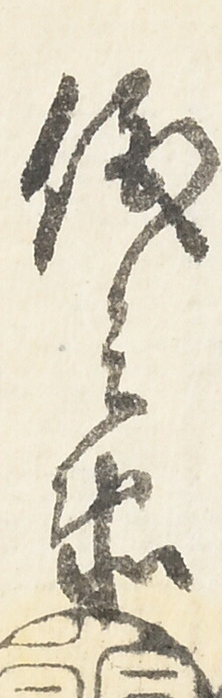儀兵衛
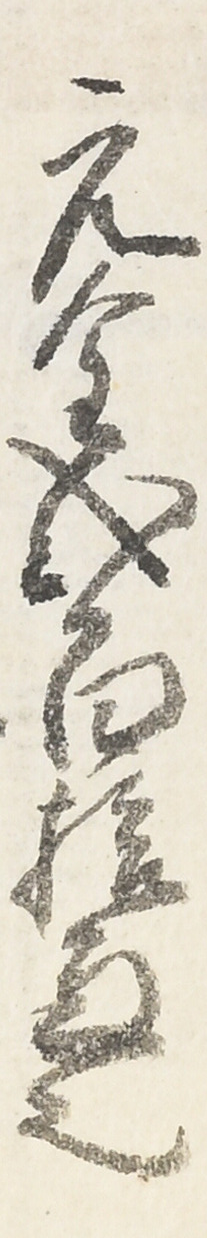元金弐百拾両也
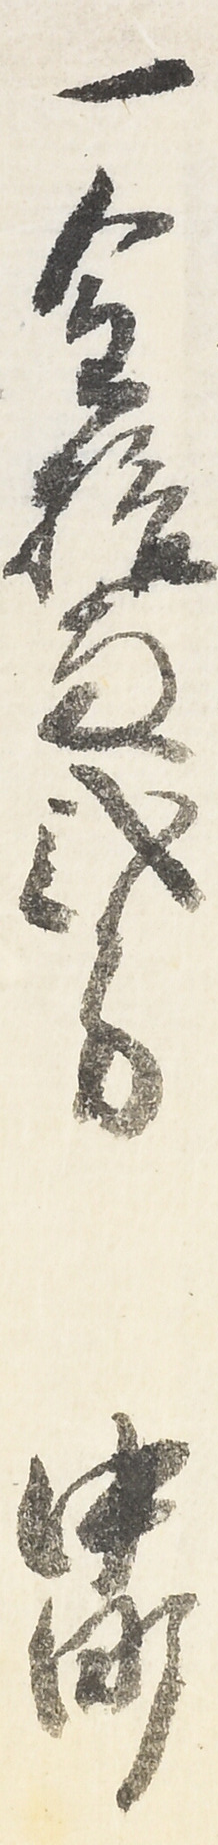一金拾両弐分中町
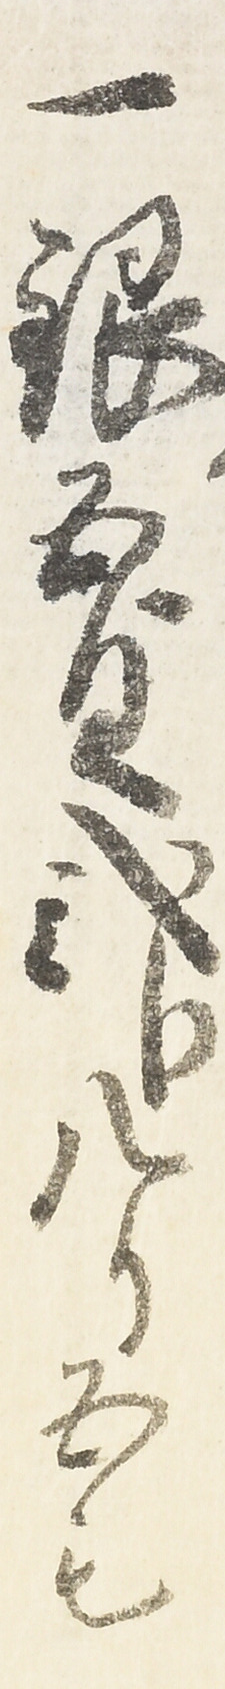一銀五匁弐分八厘五毛
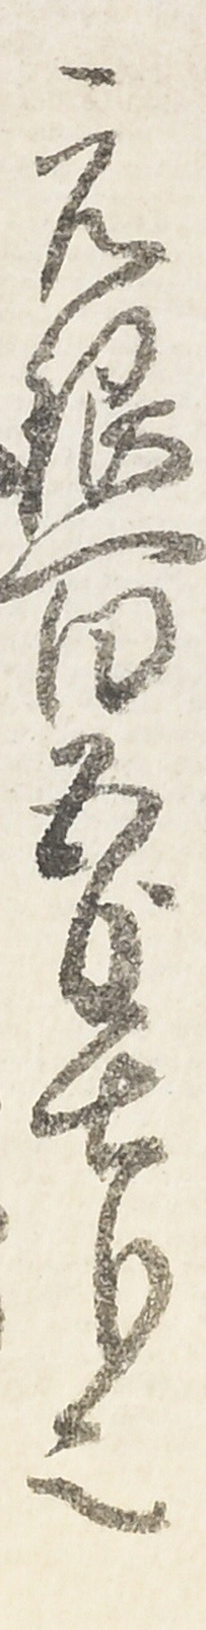元銀百五匁七分也
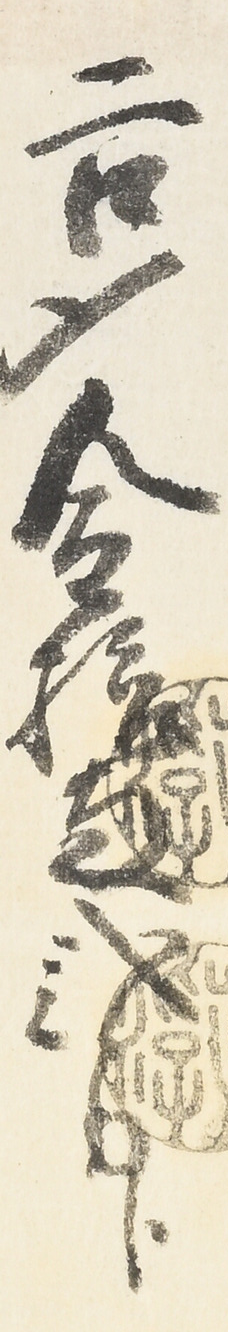二口〆金拾両弐分ト
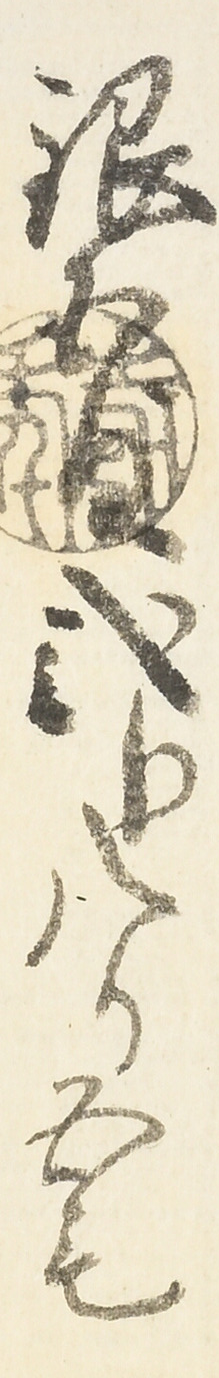銀五匁弐分八厘五毛
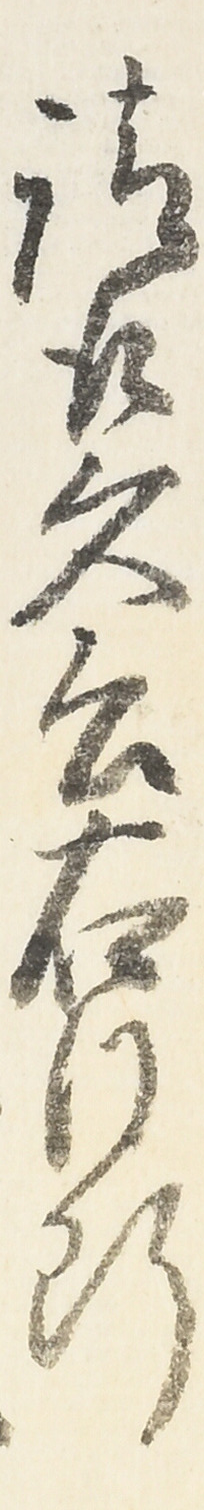請取文言右同断
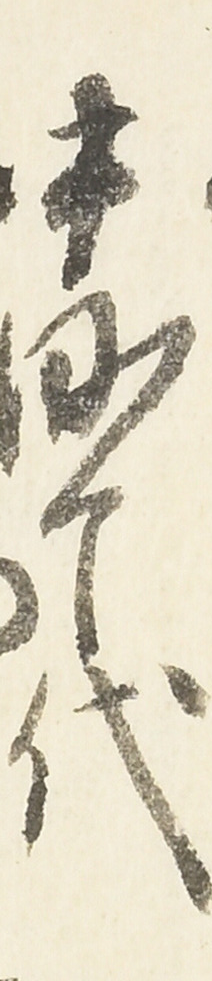中町丁代
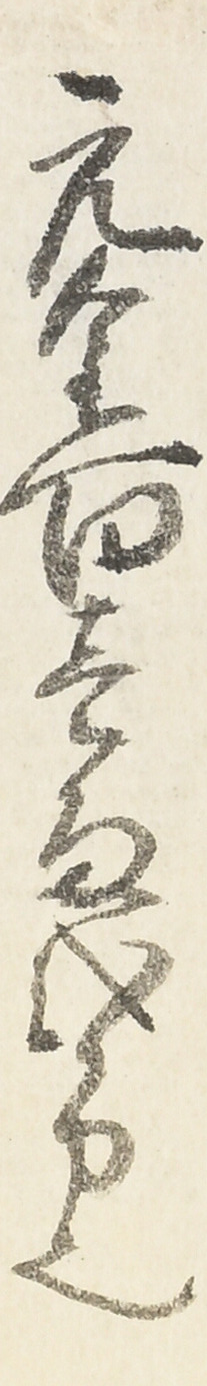元金百壱両弐分也
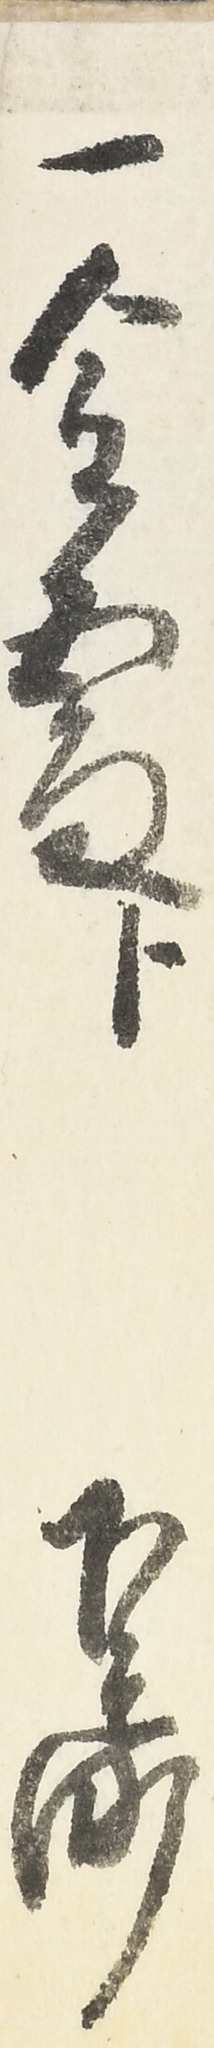一金五両ト下モ町
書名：御才覚金御利足割渡扣帳
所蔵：伊那市立高遠町図書館・合同会社AMANE
